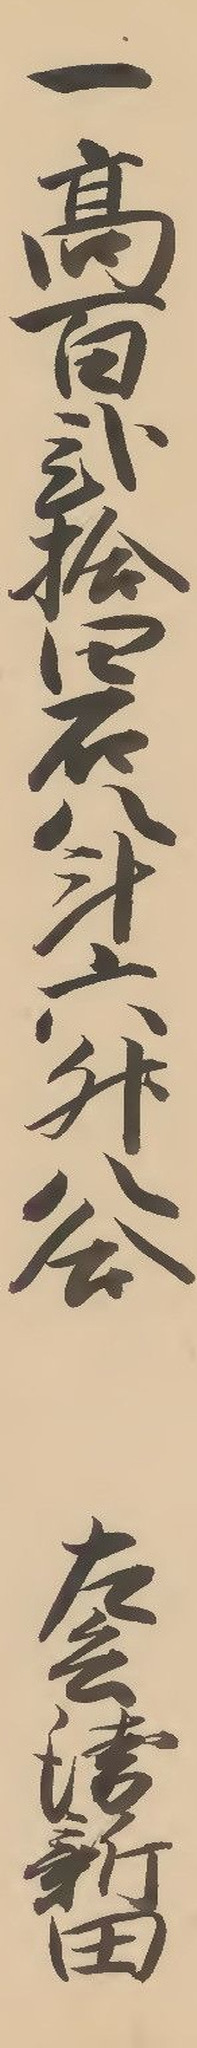一高百弐拾四石八斗六升八合左兵衛新田

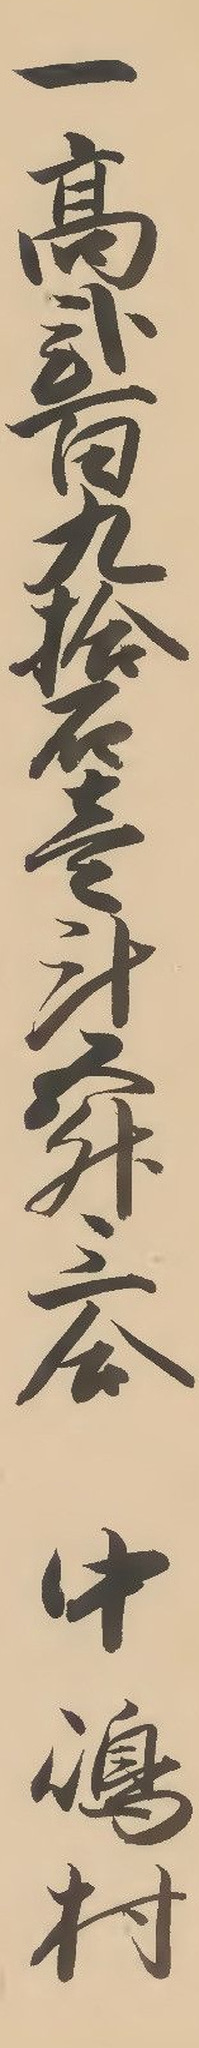一高弐百九拾石壱斗五升三合中島村
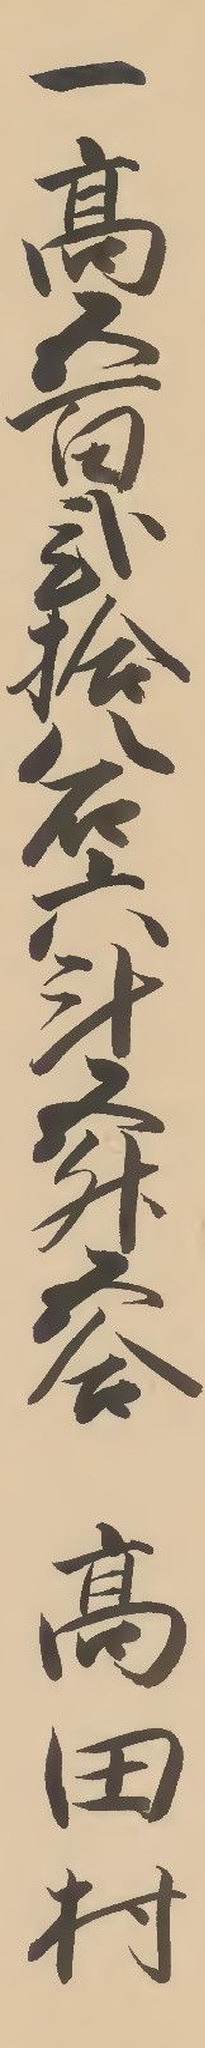一高五百弐拾八石六斗五升五合高田村
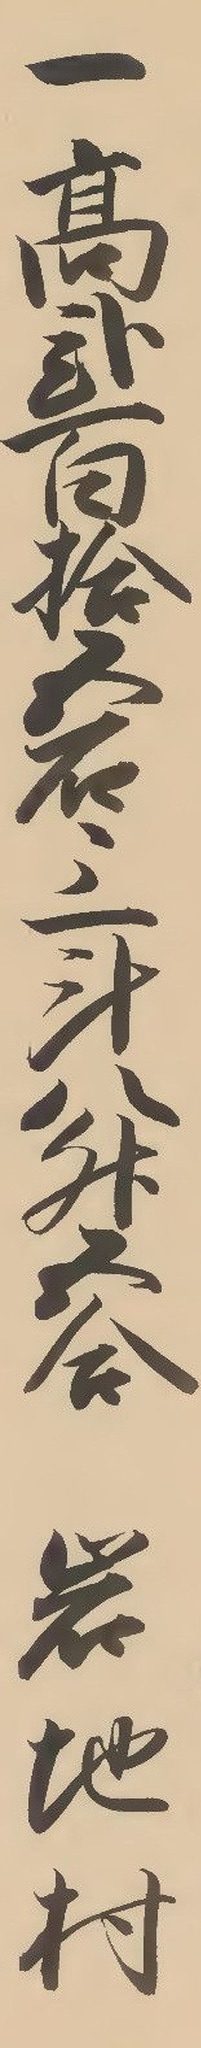一高弐百拾五石三斗八升五合岩地村
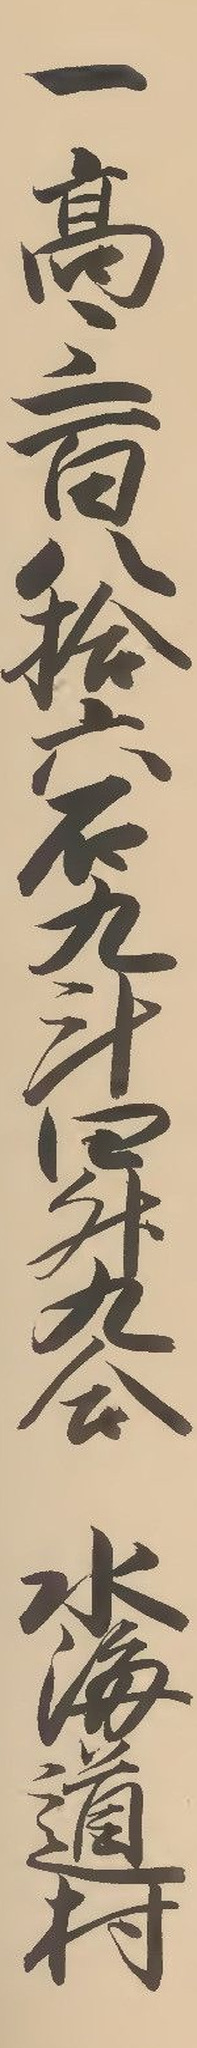一高三百八拾六石九斗四升九合水海道村
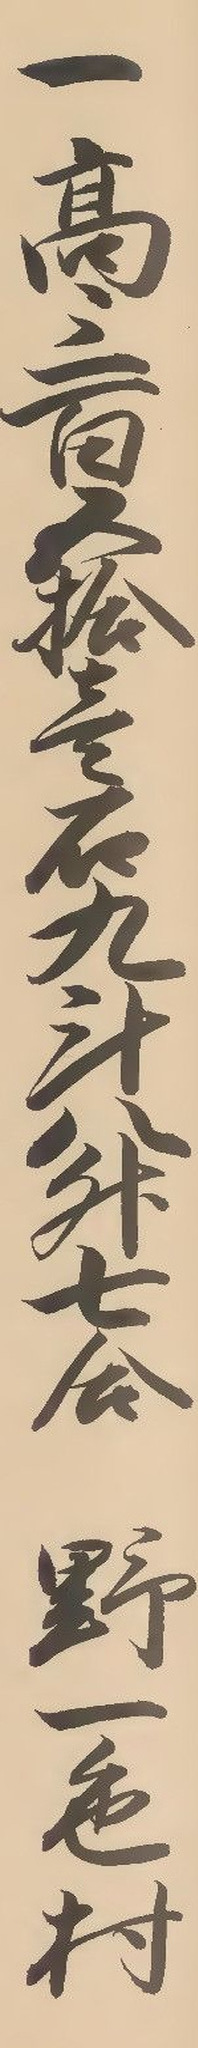一高三百五拾壱石九斗八升七合野一色村
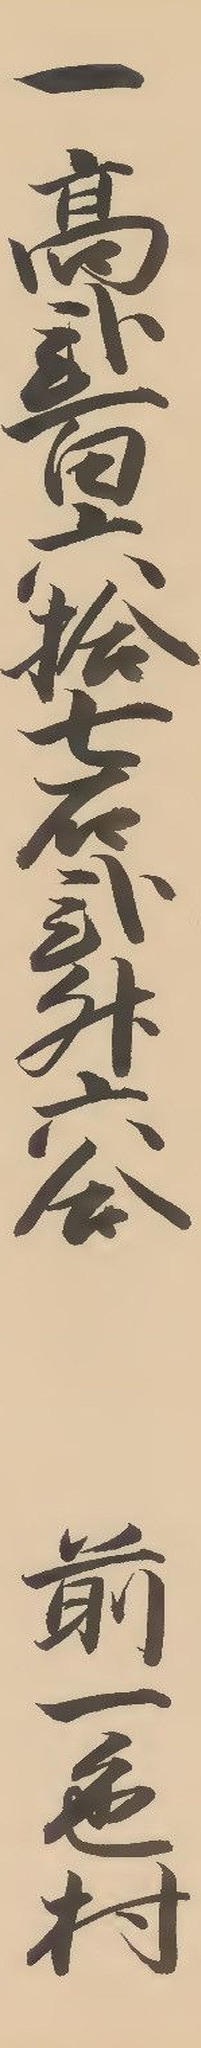一高弐百六拾七石弐升六合前一色村
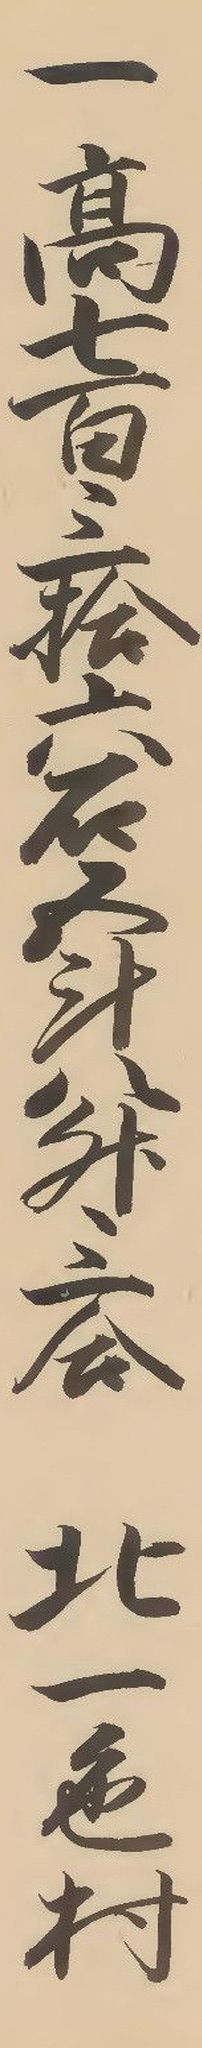一高七百三拾六石五斗八升三合北一色村
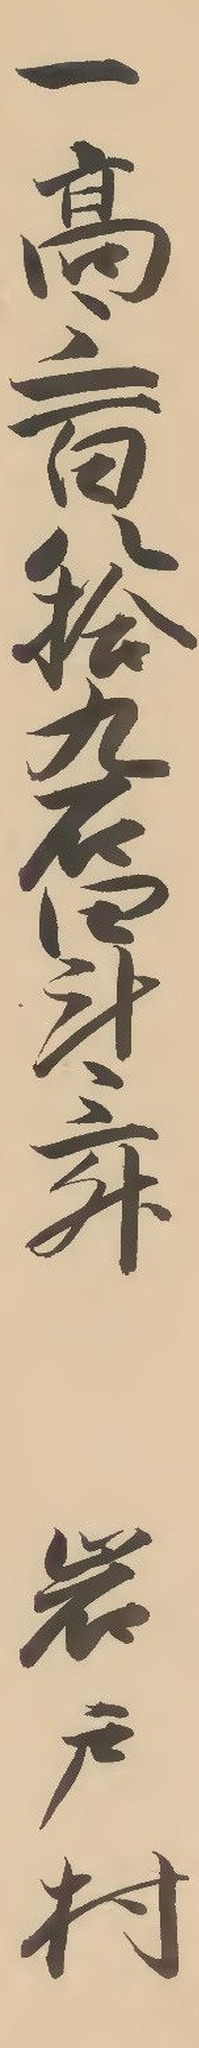一高三百八拾九石四斗三升岩戸村

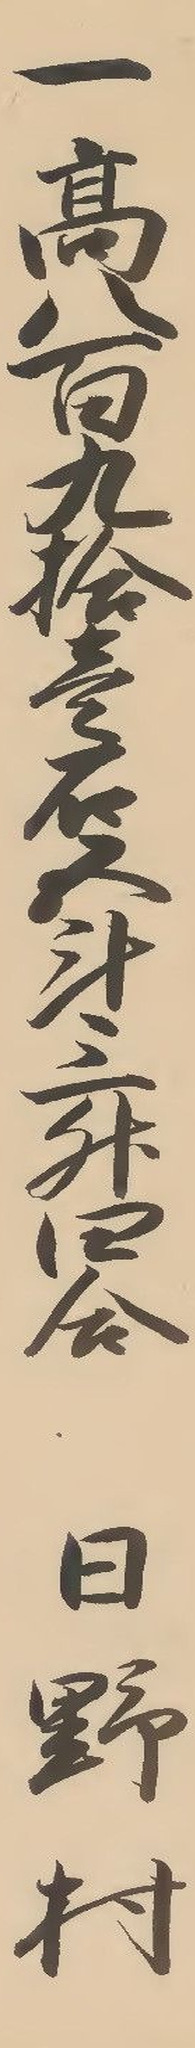一高八百九拾壱石五斗三升四合日野村
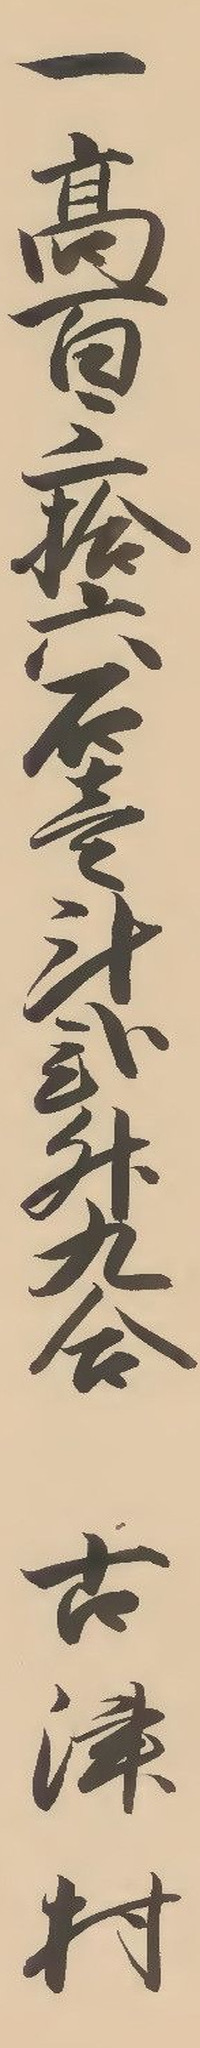一高百三拾六石壱斗弐升九合古津村
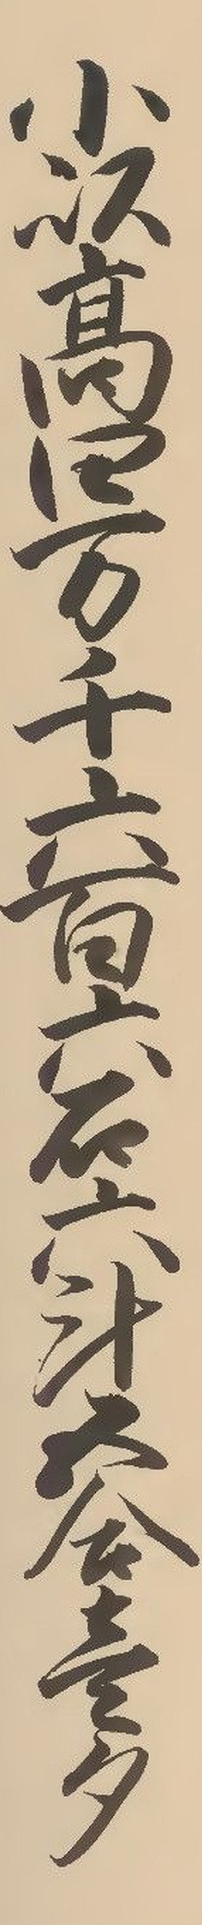小以高四万千六百六石六斗五合壱勺

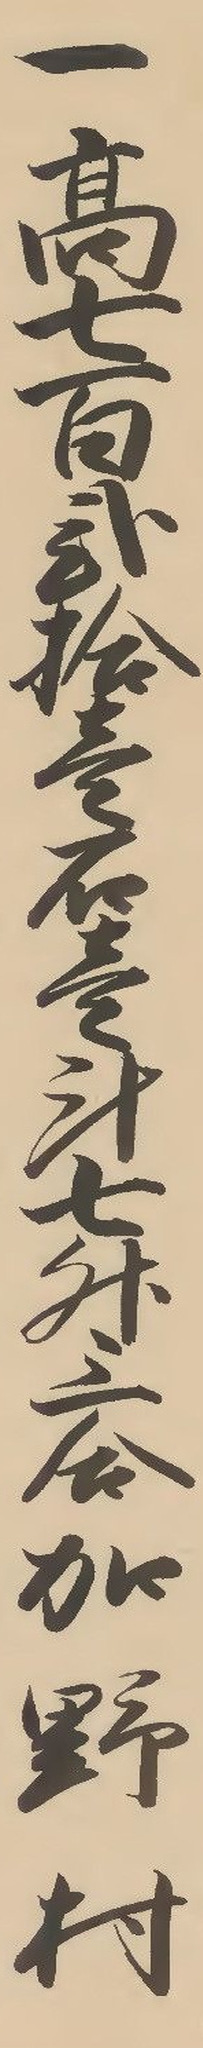一高七百弐拾壱石壱斗七升三合加野村
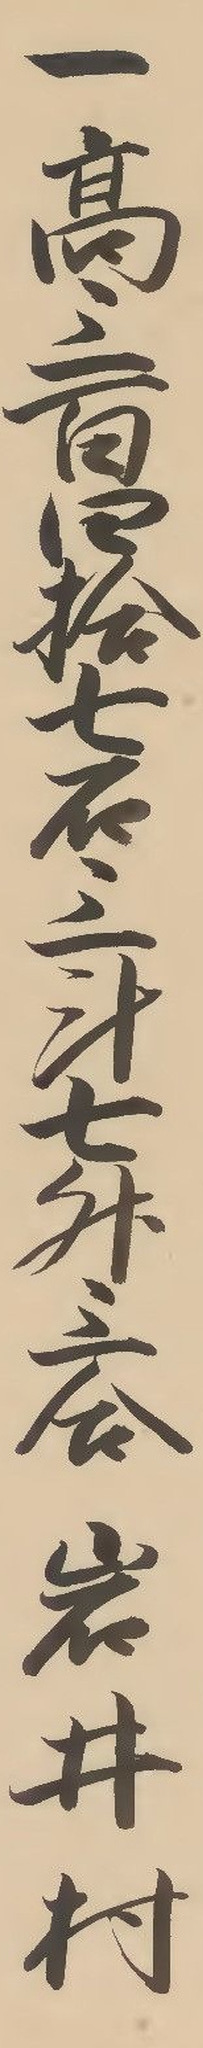一高三百四拾七石三斗七升三合岩井村
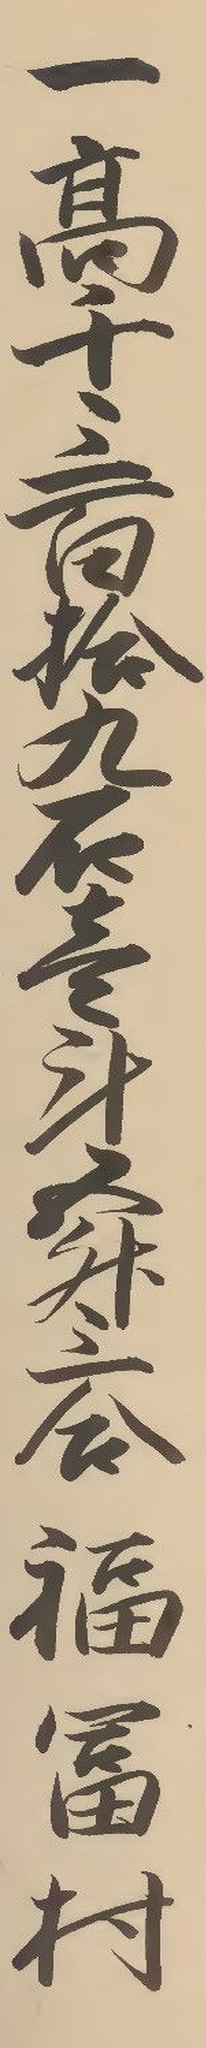一高千三百拾九石壱斗五升三合福富村
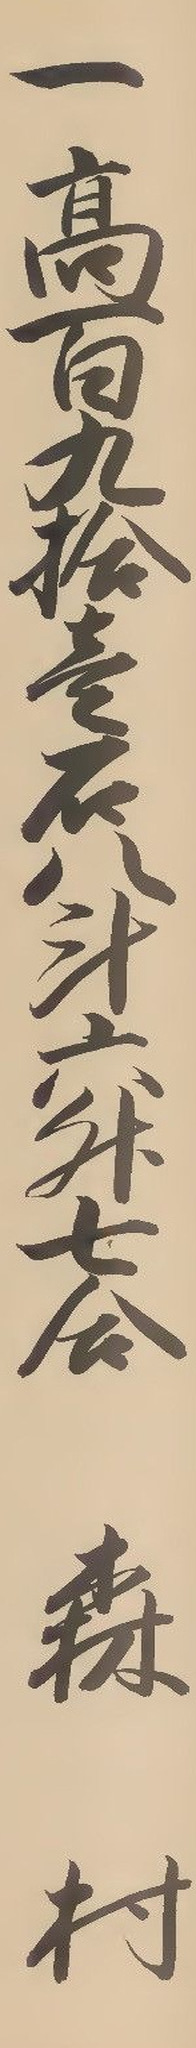一高百九拾壱石八斗六升七合森村
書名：美濃国郷帳
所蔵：国立公文書館 National Archives of Japan
